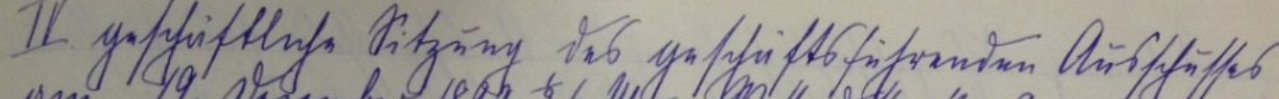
IV. Geschäftliche Sitzung des geschäftsführenden Ausschusses
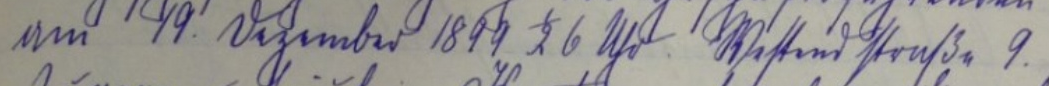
am 19. Dezember 1899 ½ 6 Uhr Westendstraße 9
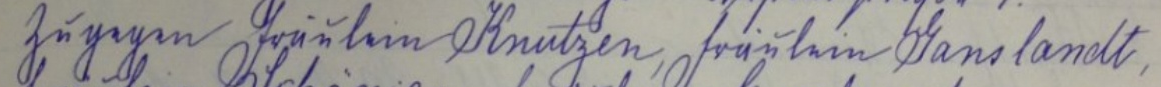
Zugegen: Fäulein Knutzen, Fräulein Ganslandt,
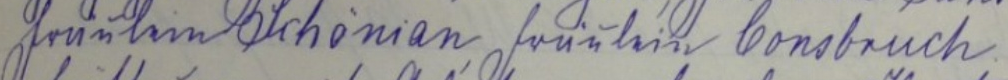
Fräulein Schönian, Fräulein Consbruck
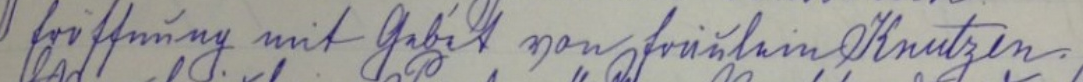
Eröffnung mit Gebet von Fräulein Knutzen.
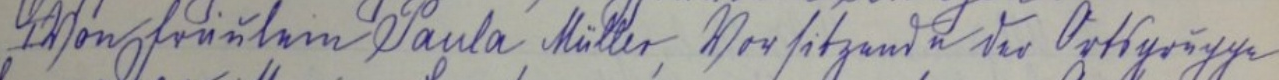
I Von Fräulein Paula Müller, Vorsitzende der Ortsgruppe
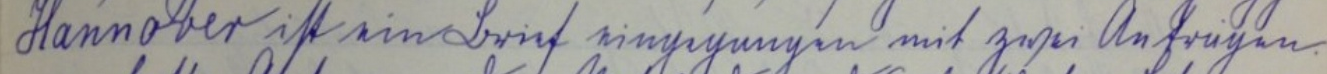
ist ein Brief eingegangen mit zwei Anträgen.
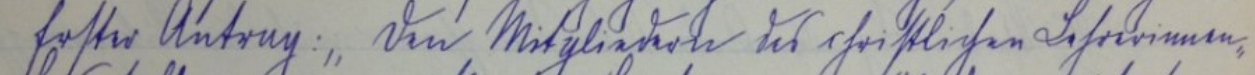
Erster Antrag: „Von Mitgliedern des christlichen Lehrerinnen
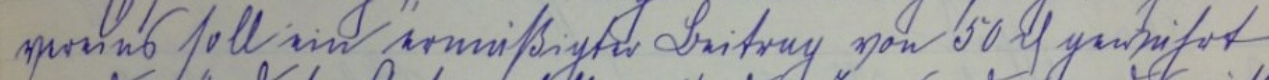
vereins soll ein ermäßigter Beitrag von 50 Pf gewährt
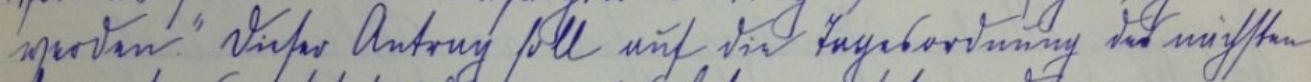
werden." Dieser Antrag soll auf der Tagesordnung des nächsten
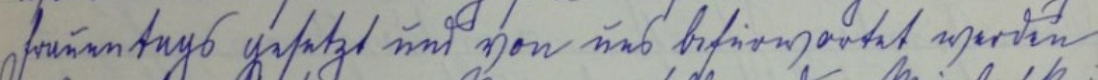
Frauentages gesetzt und von uns beführwortet werden.
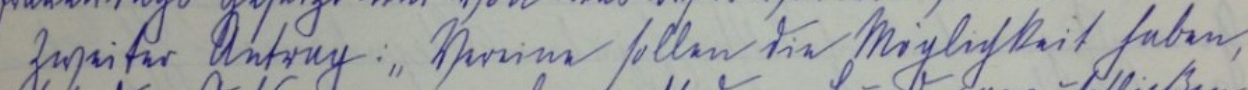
Zweiter Antrag: „Vereine sollen die Möglichkeit haben
